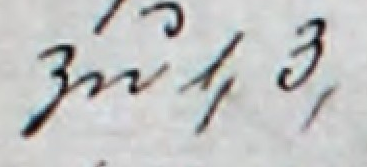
zu 1, 3,
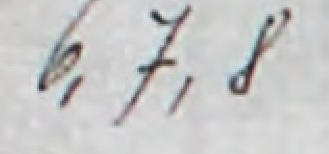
6, 7, 8
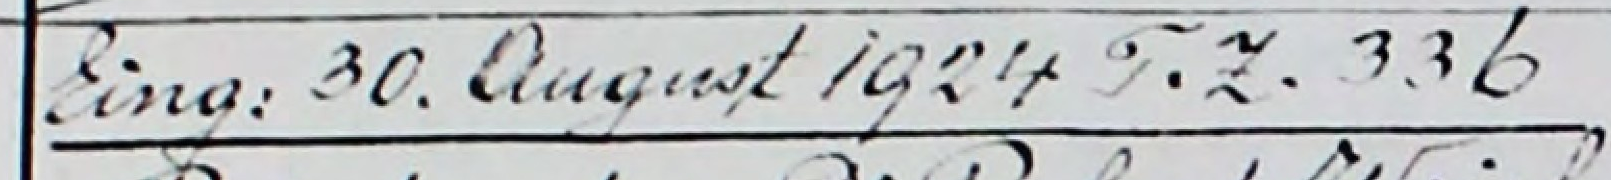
Eing: 30. August 1924 T.Z. 336
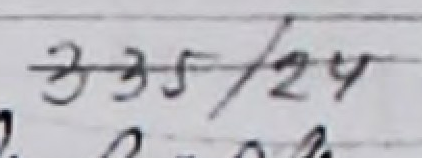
335/24
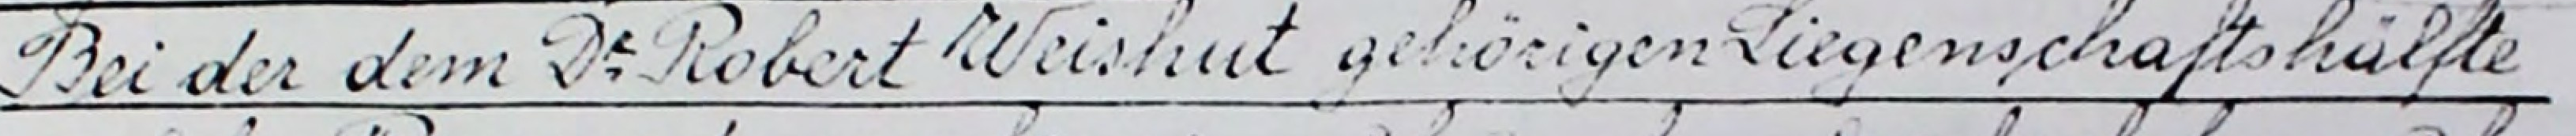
Bei der dem Dr Robert Weishut gehörigen Liegenschaftshälfte
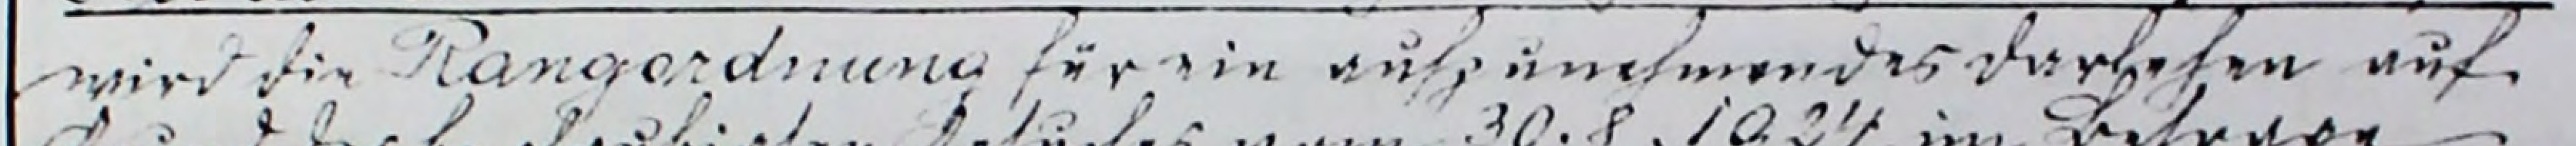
wird die Rangordnung für ein aufzunehmendes Darlehen auf
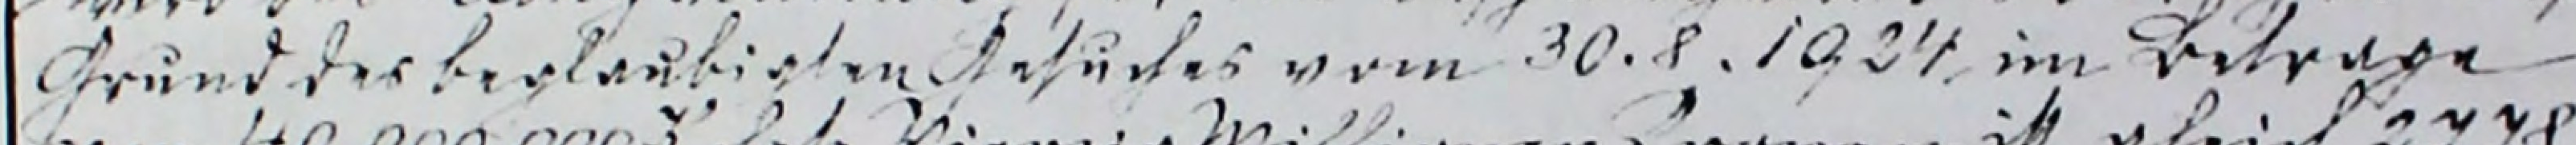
Grund des beglaubigten Gesuches vom 30. 8. 1924, im Betrage
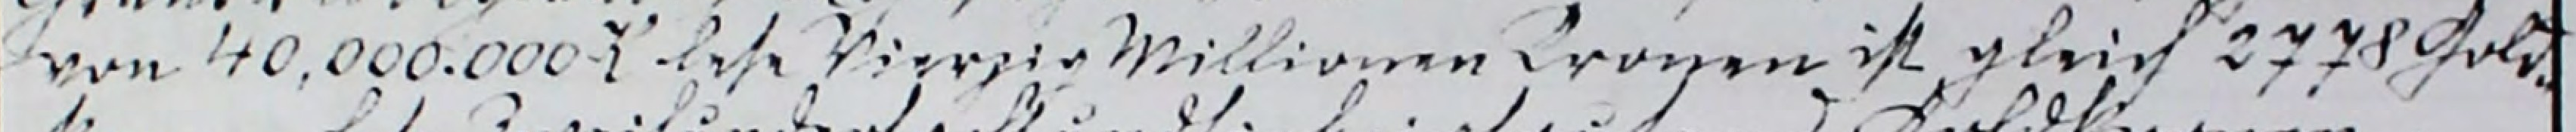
von 40,000.000 K lese Vierzig Millionen Kronen ist gleich 2778 Gold„
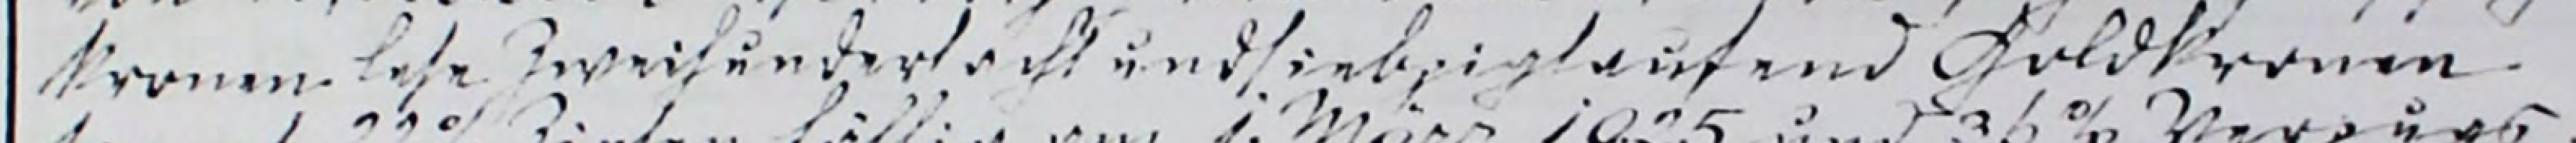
kronen lese Zweihundert acht und siebzigtaufend Goldkronen
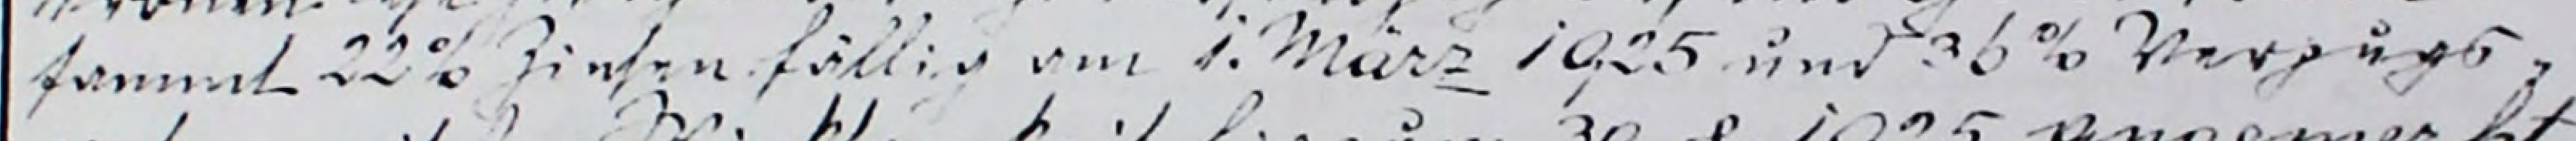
sammt 23 % Zinsen fällig am 1. März 1925 und 36 % Verzugs
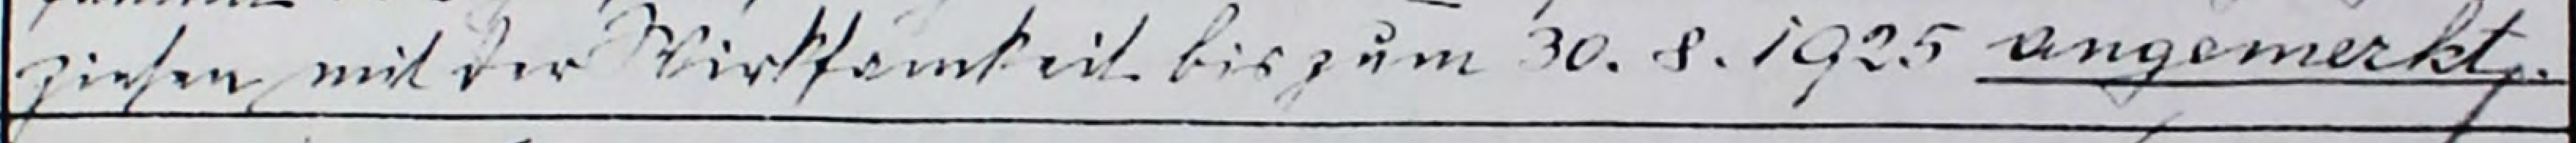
zinsen, mit der Wirksamkeit bis zum 30. 8. 1925 angemerkt.
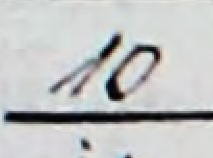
10
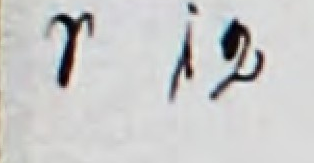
s 12
